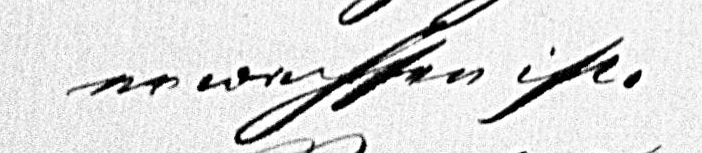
erwachsen ist.
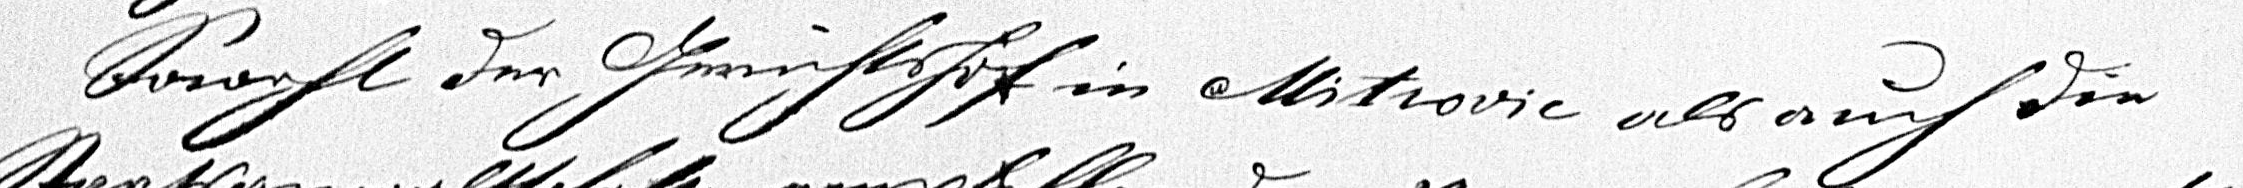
Sowohl der Gerichtshof in Mitrovic als auch die
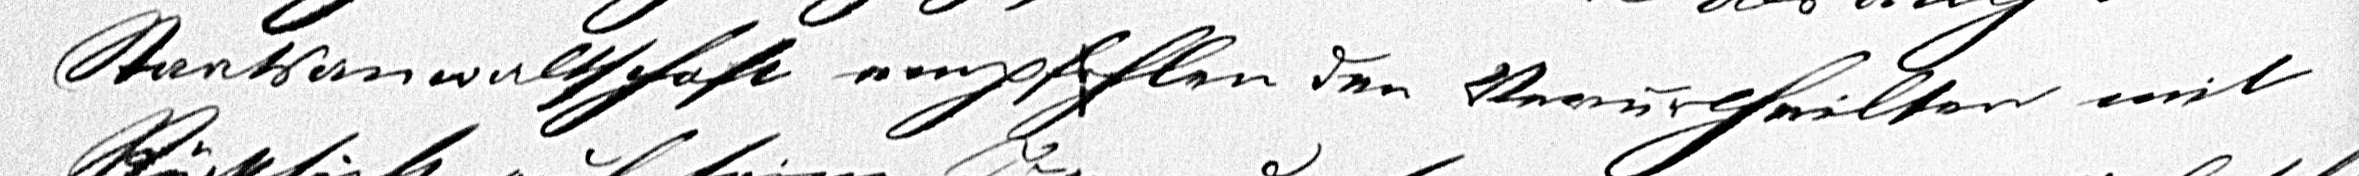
Staatsanwaltschaft empfehlen den Verurtheilten mit
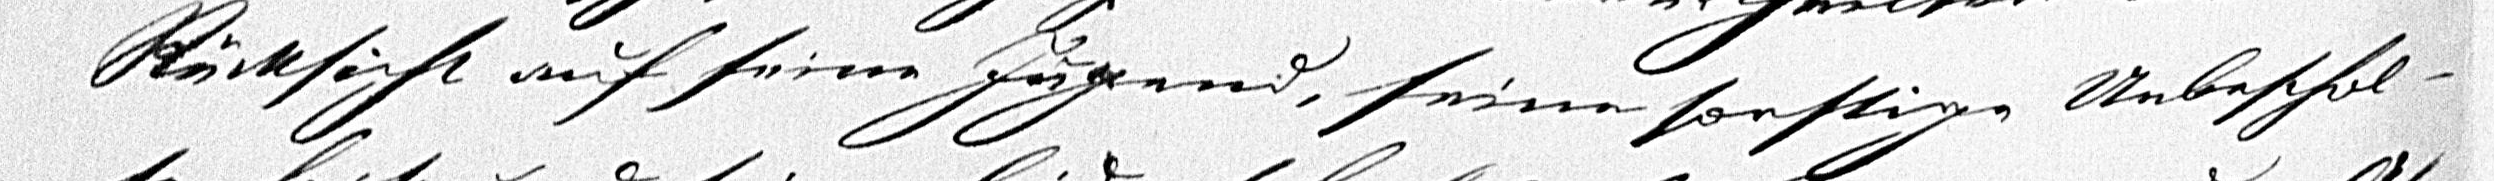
Rücksicht auf seine Jugend, seine sonstige Unbeschol¬
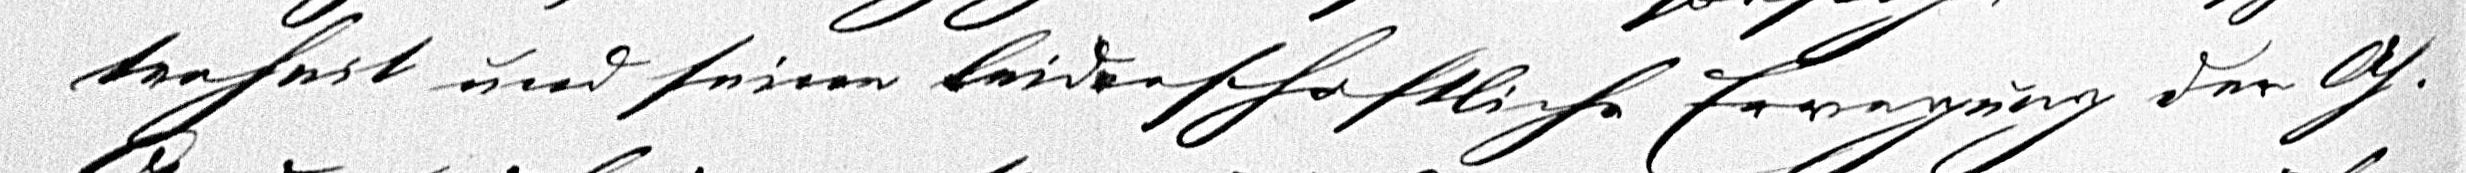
tenheit und seine leidenschaftliche Erregung der Ah.
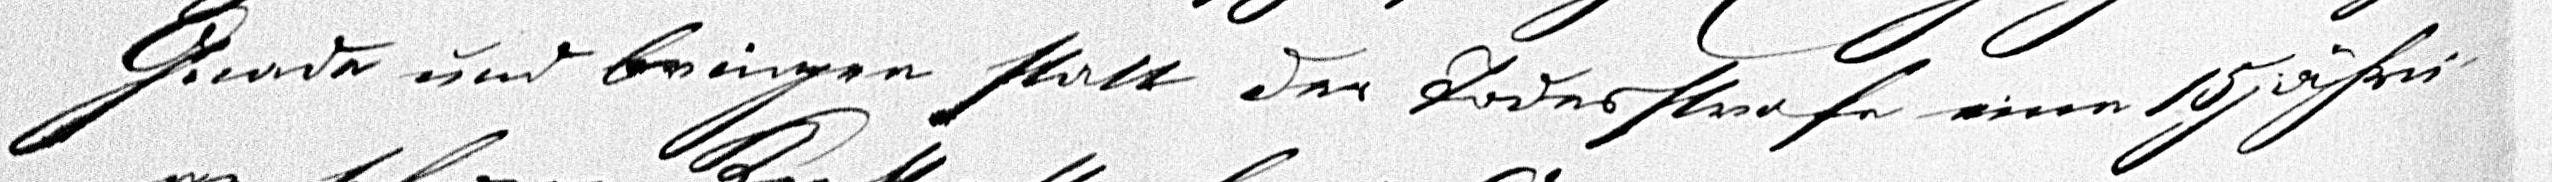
Gnade und bringen statt der Todesstrafe eine 15jähri¬
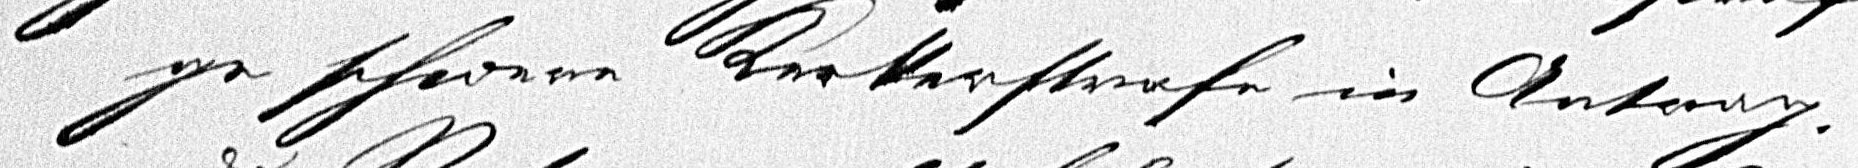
ge schwere Kerkerstrafe in Antrag.
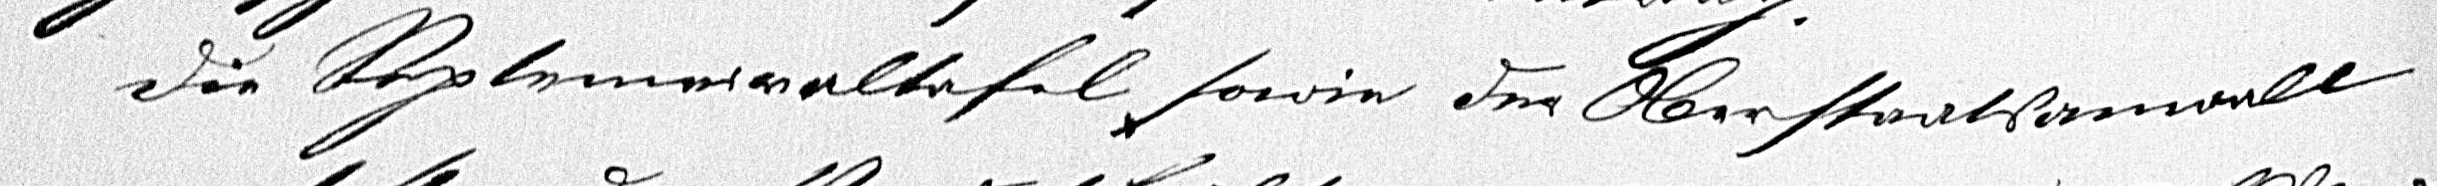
Die Septemviraltafel sowie der Oberstratsanwalt
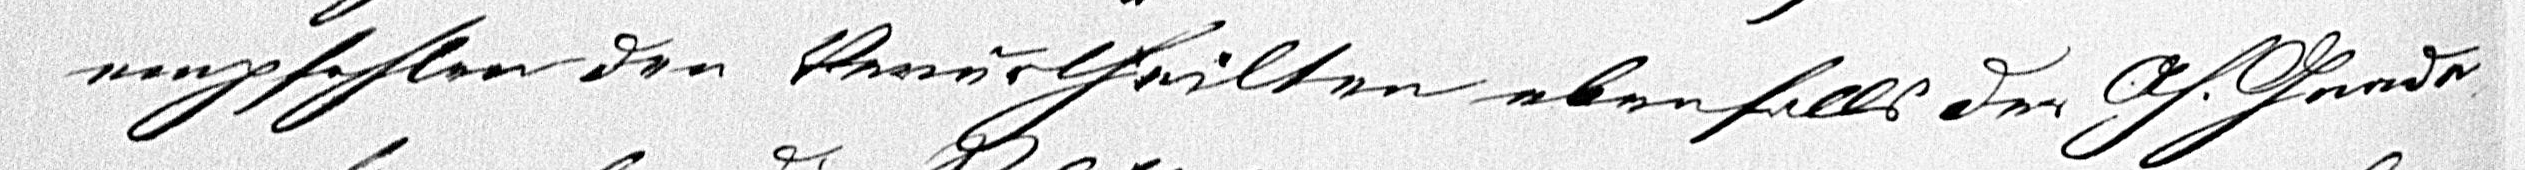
empfehlen der Verurtheilten ebenfalls der Ah. Gnade
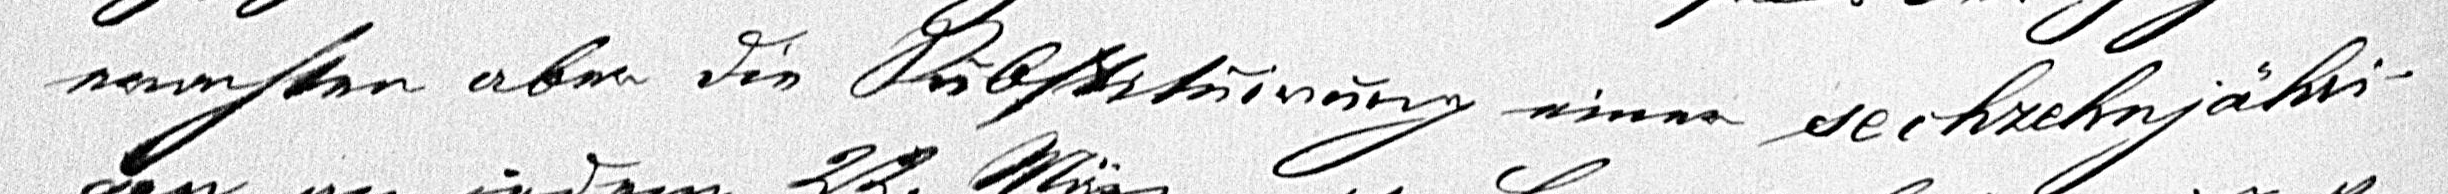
erwehten aber die Substituirung einer sechzehnjähri¬
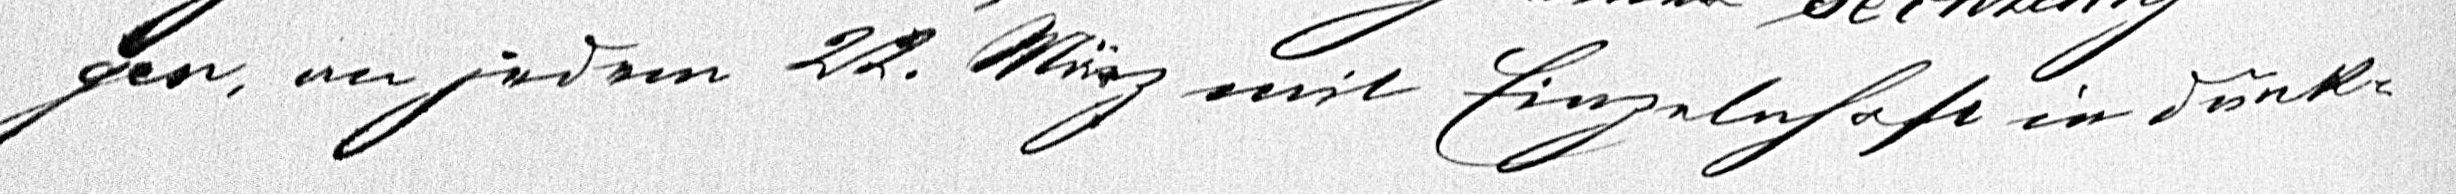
gen, an jedem 22. März mit Einzelnhaft in Dunk¬
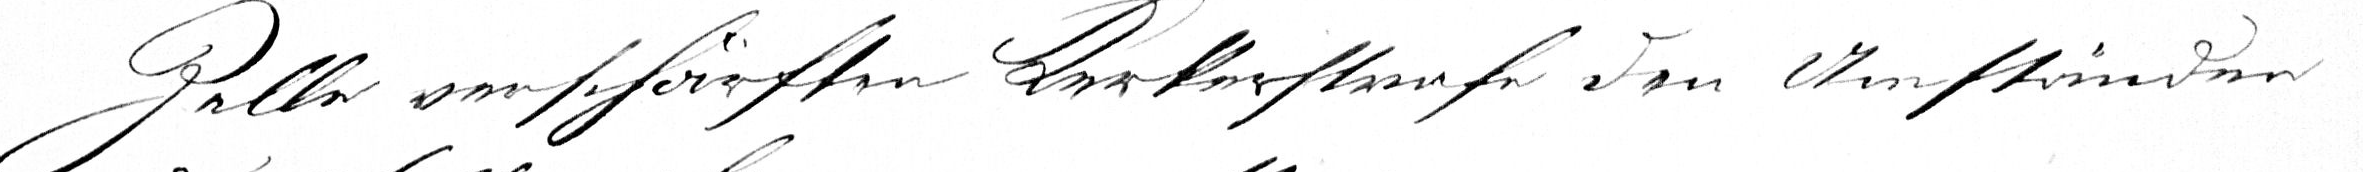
Zelle verschärften Kerkerstrafe den Umständen
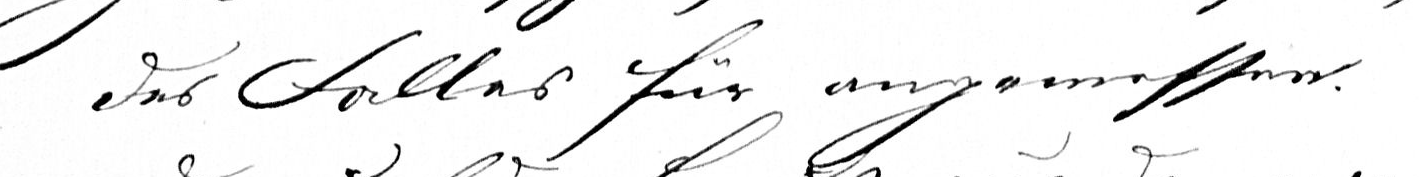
des Falles für angemessen.
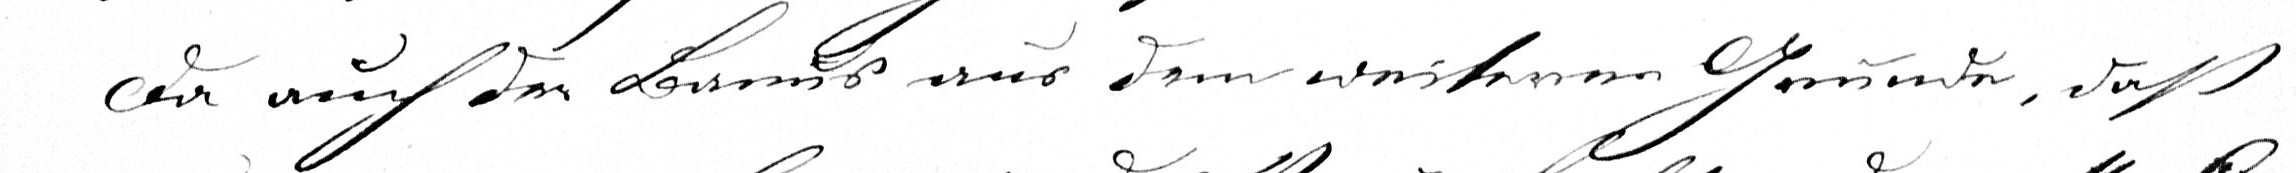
Da auch der Banus aus dem weiteren Grunde, daß
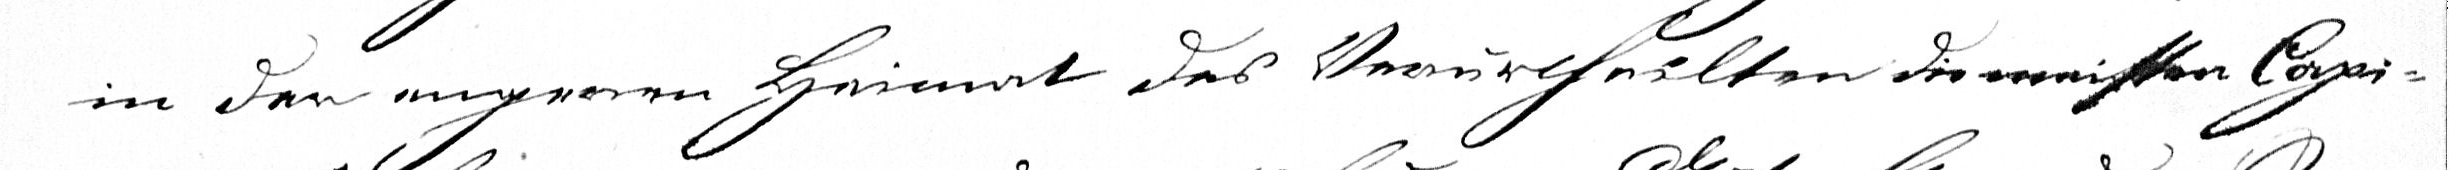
in der engxxren Heimat des Verurtheilten die meisten Kapi¬
